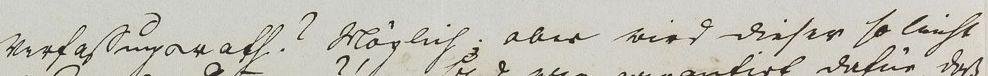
Verfassungsrath? Möglich; aber wird dieser so leicht
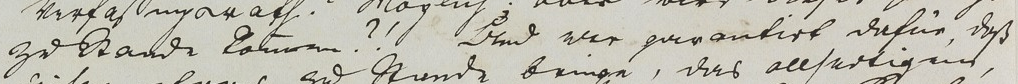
zu Stande kommen?! Und wer garantirt dafür, daß
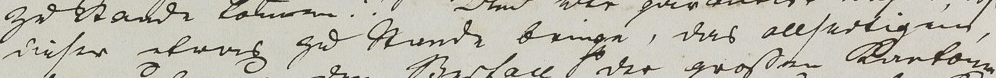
dieser etwas zu Stande bringe, das allseitigen,
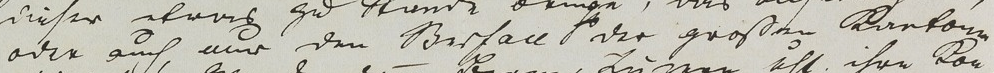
oder auch nur den Beifall der großen Kantone
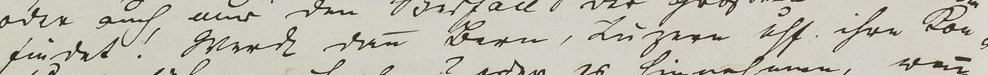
findet! Werden dann Bern, Luzern usf. ihre Kon-
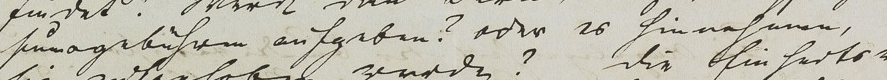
sumogebühren aufgeben? oder es hinnehmen,
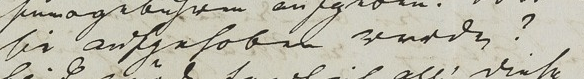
sie aufgehoben werden?
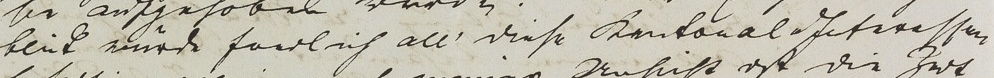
blick würde freilich all' diese Kantonal-Interessen
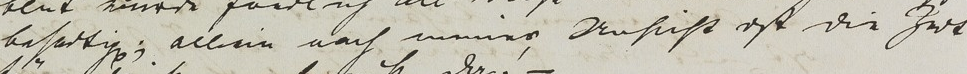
beseitigen; allein nach meiner Ansicht ist die Zeit
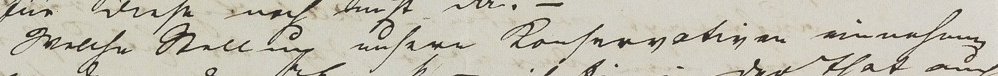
Welche Stellung unsere Konservativen einnehmen
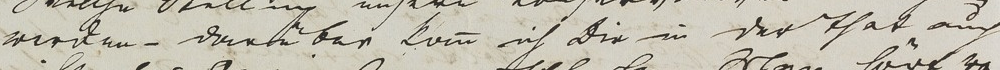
werden – darüber kann ich Dir in der That auch
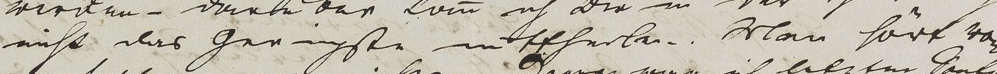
nicht das Geringste mittheilen. Man hört von
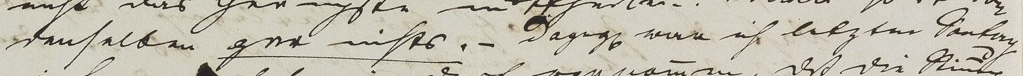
denselben gar nichts. – Dagegen war ich letzten Sontag
